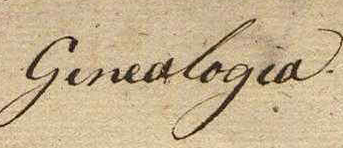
Genealogia.
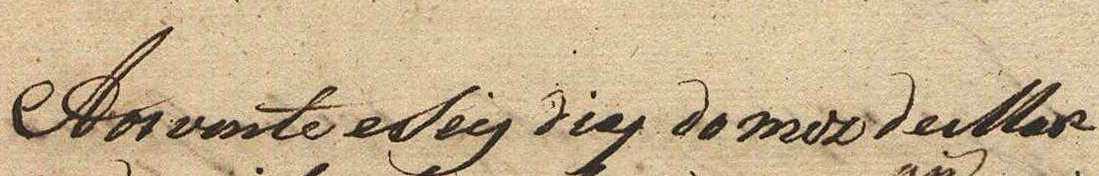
Aos vinte e seis dias do mez de Mar
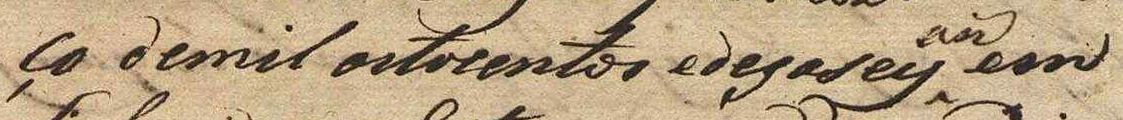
ço de mil oitocentos e dezaseis an̄ em
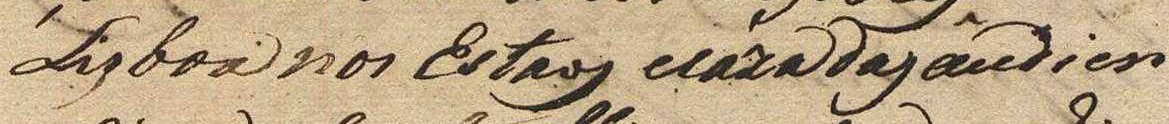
Lizboa nos Estaos e caza das audien
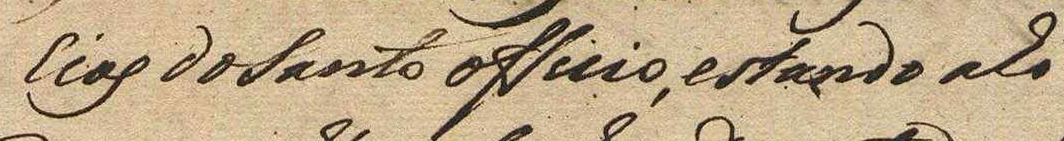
cias do Santo officio, estando ahi
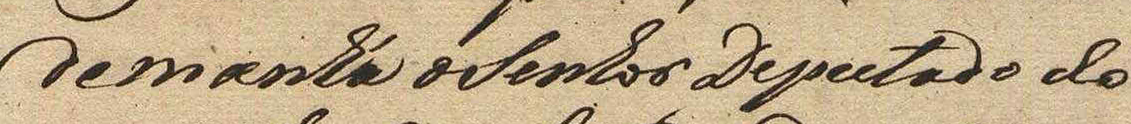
de manhã o Senhor Deputado do
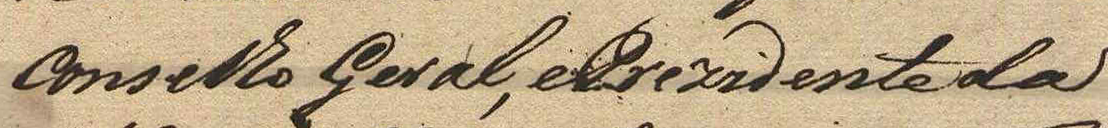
conselho Geral, e Prezidente da
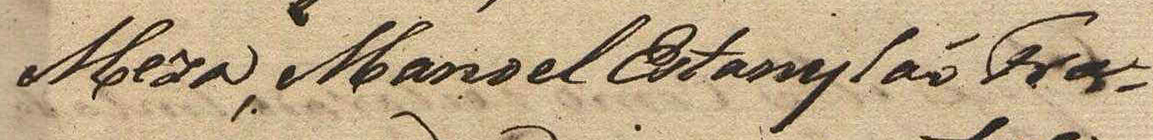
Meza Manoel Estanislaó Fra
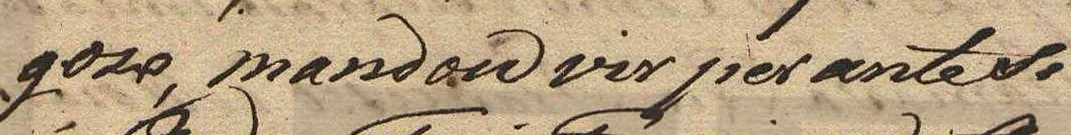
gozo, mandou vir perante si
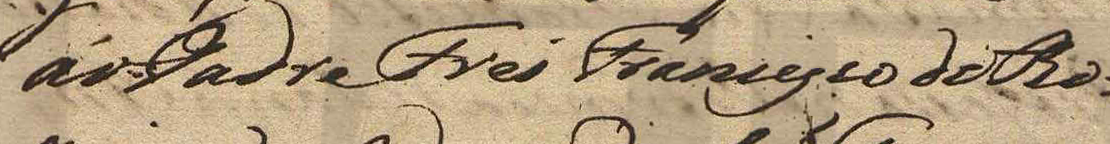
ao Padre Frei Francisco do Ro
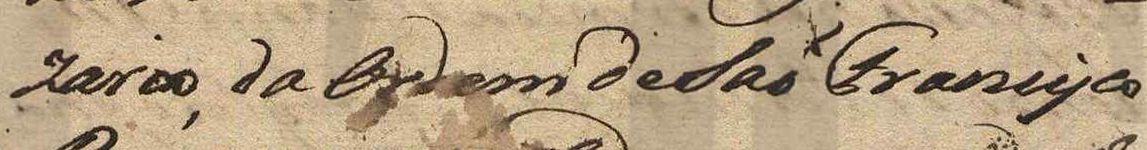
zario, da Ordem de Saõ Francisco
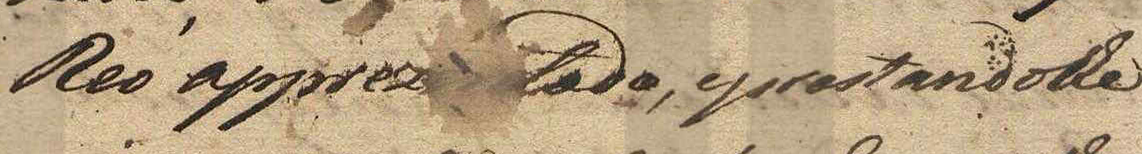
Reo apprez_tado, e prestandolhe
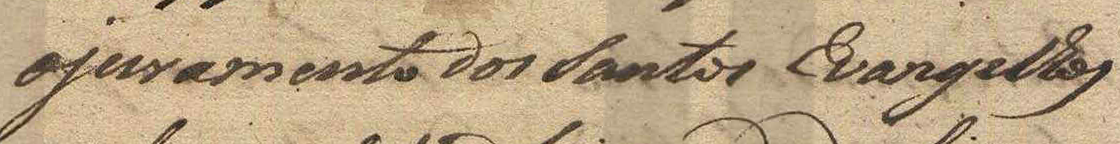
o juramento dos Santos Evangelhos
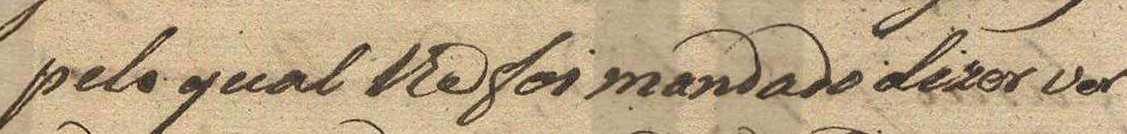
pelo qual lhe foi mandado dizer ver
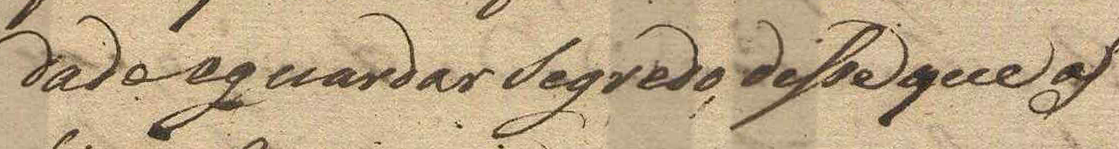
dade e guardar segredo, disse que as
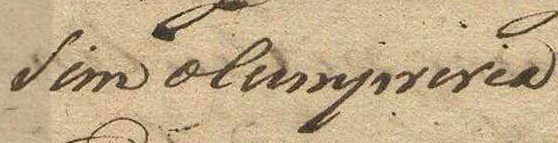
sim o Cumpriria
